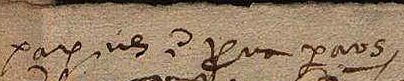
papeis ē ꝓua ꝑa os
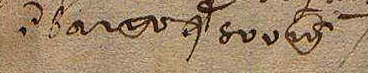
ēbargos soomte
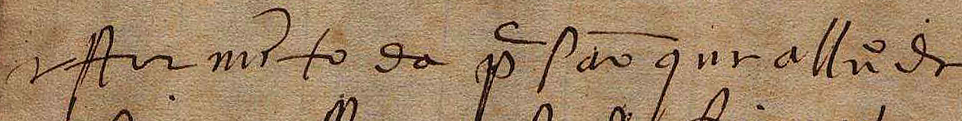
estormēto da p̄são que alluo de
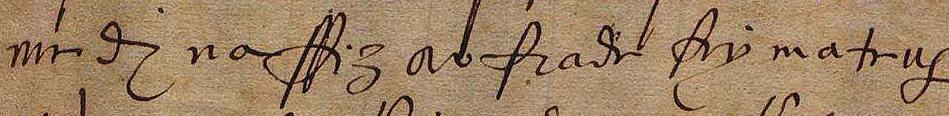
medjna ffez ao frade frey mateus
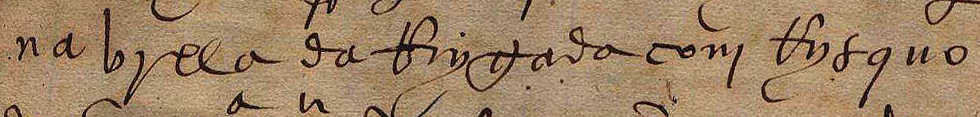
na vjlla da Reygada com Rysquo
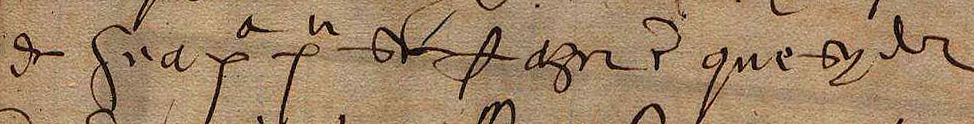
de sua pa pa se fazer ēquesydor
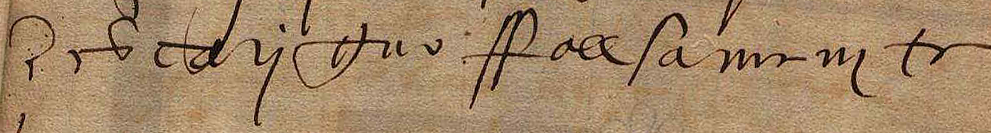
ē escarjguo ffallsamemte
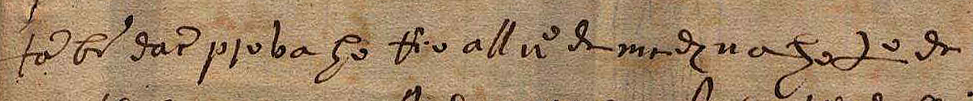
tābē da ē prova ho Reo alluo de medjna ho to de
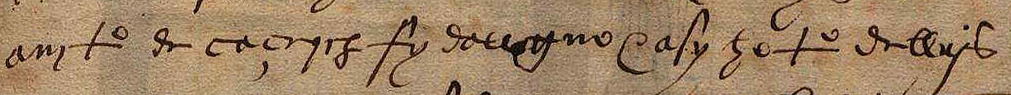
amto de caçeres fydallguo e asy ho to de llujs
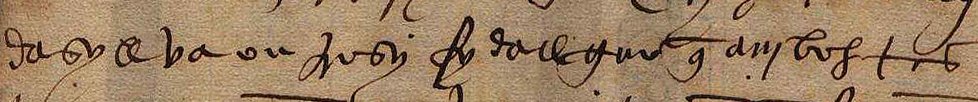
da syllva outrosy fydallguo q̄ ambos tas
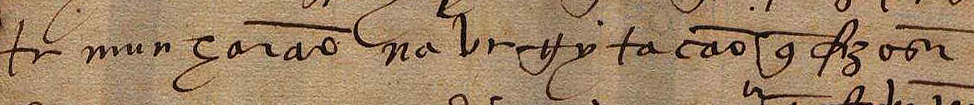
temunharão na vegytacão q̄ fez o sōr
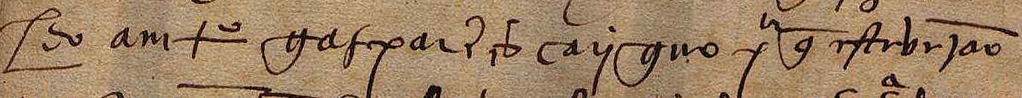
Ldo amto gaspar ē escarjguo pa q̄ esteverão
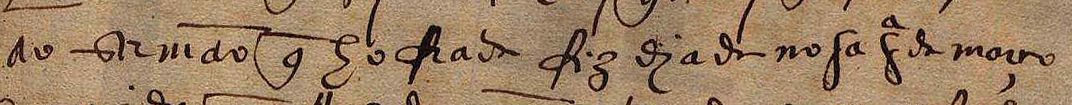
ao sermão q̄ ho frade fez dja de nosa sa de março
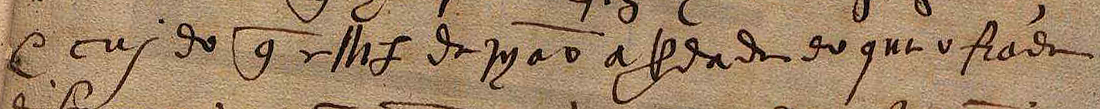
e cujdo q̅ elles daryão a ꝟdade do que o frade
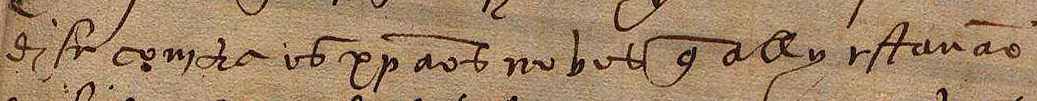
dise comtra os xpãos novos q̄ ally estauão
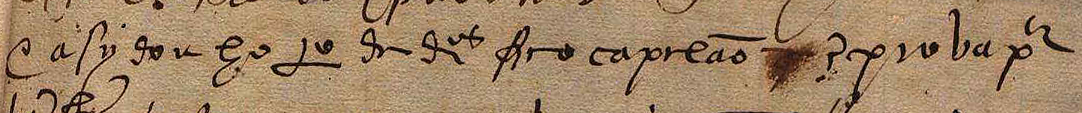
e asy dou ho to de dos frco capelão _ ē prova por
